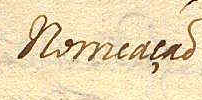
Nomeaçaõ
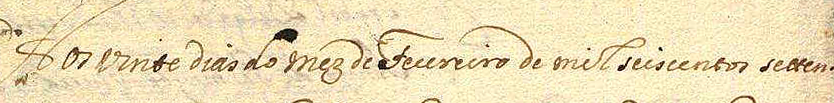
Aos vinte dias do mez de Feuereiro de mil seiscentos setten
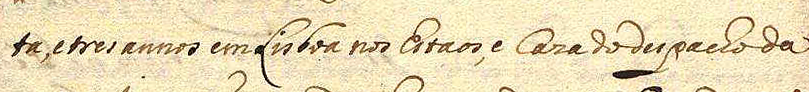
ta, e tres annos em Lisboa nos Estaos, e Caza do despacho da
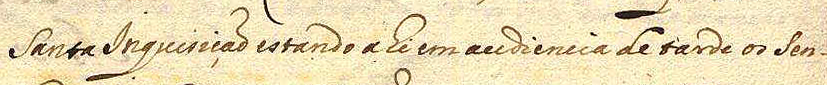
Santa Inquisição estando ahi em audiencia de tarde os sen
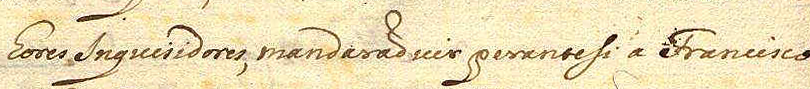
hores Inquisidores, mandaraõ uir perante si a Francisco
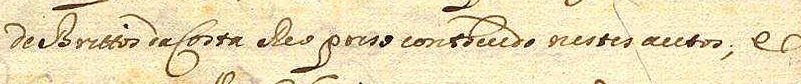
de Brittos da Costa Reo preso contheudo nestes autos, e
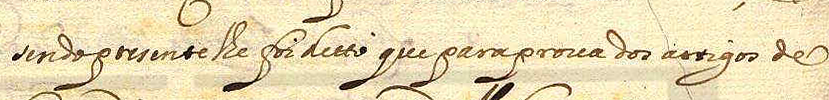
sendo presente lhe foi ditto que para proua dos artigos de
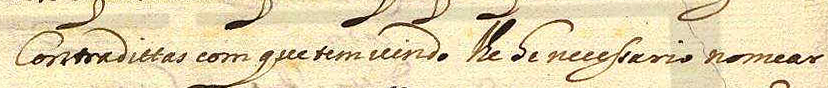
Contradittas com que tem uindo lhe he necessario nomear
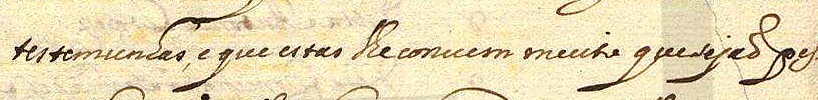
testemunhas, e que estas lhe conuem muito que sejaõ pes
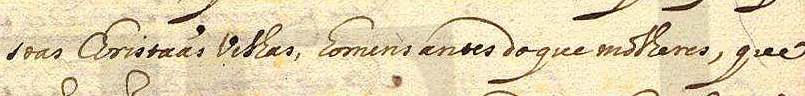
soas Christaās velhas, homens antes do que molheres, que
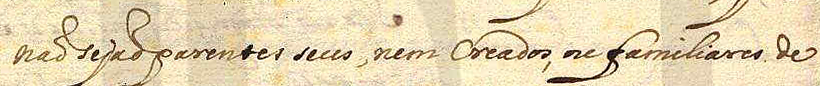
naõ sejaõ parentes seus, nem creados, ou familiares de
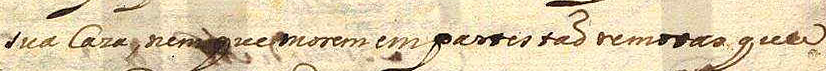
sua caza, nem que morem em partes taõ remotas que
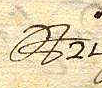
21
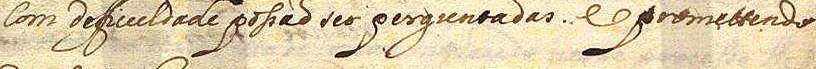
com defficuldade possaõ ser perguntadas. e promettendo
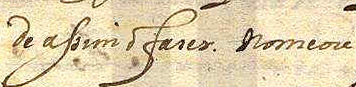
de assim o fazer nomeou
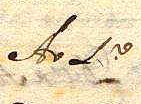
Ao 1.o
